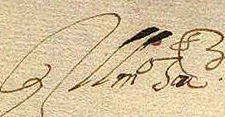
Jllmo Sn.r
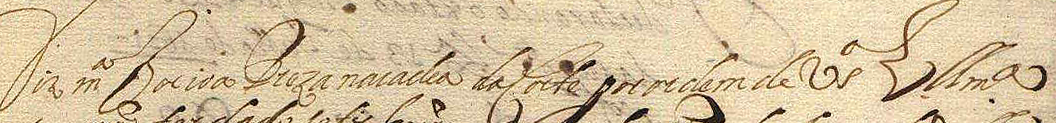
Diz ma Jorioa Preza na cadea da Corte por ordem de Vsa Ellm.a
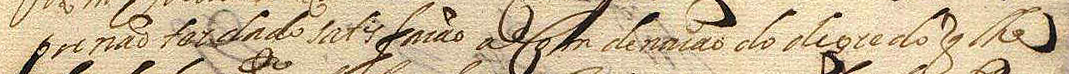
por naõ ter dado satisfição a Comdenaçaõ do degredo q̄ lhe
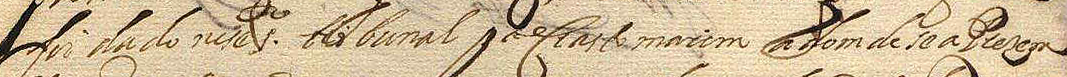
foi dado neste sto. tribunal pa Crasto marim adomde se aPrezem
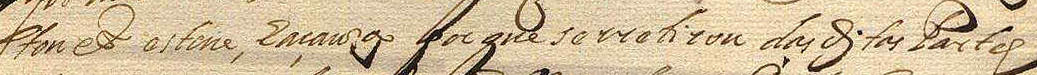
tou e esteue, E a cauza por que se rretirou das ditas Partes
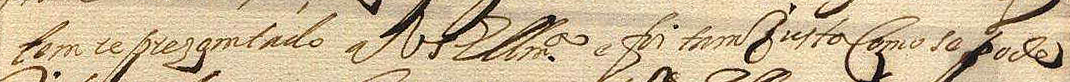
tem reprezemtado a Vs Ellm.a e foi tam Justa Como se pode
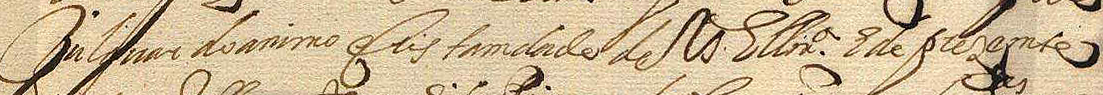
Julguar do animo e Cristamdade de Vsa Ellm.a E de prezente
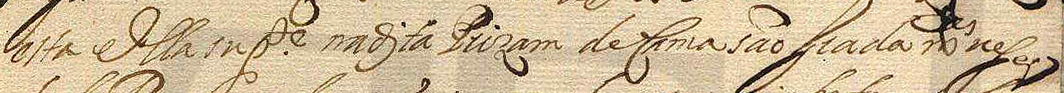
esta ella sup.te na djta Prizam de Cama saõgrada mtas ueses
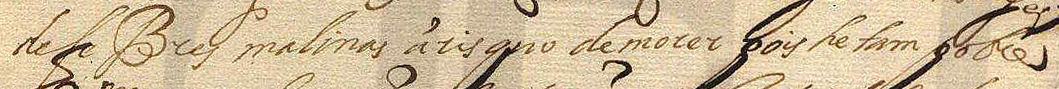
de feBres malinas á risquo de morer pois he tam pobre
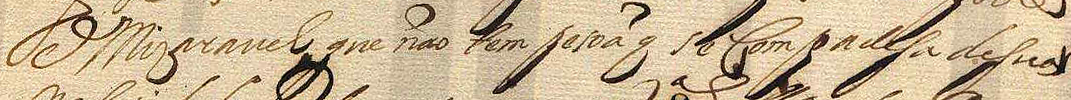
e Mizerauel que não tem pesoa q̄ se Compadesa de suas
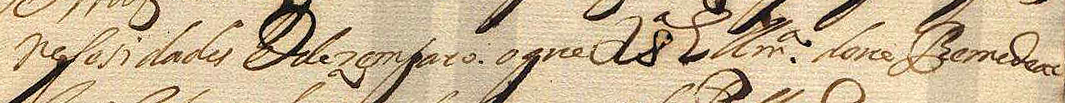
necesidades e dezemparo o que Vsa Ellm.a deue Remedear
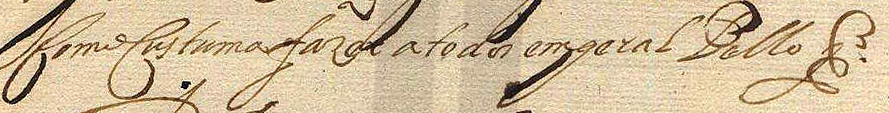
Como Custuma fazer a todos em geral Pello q̄.
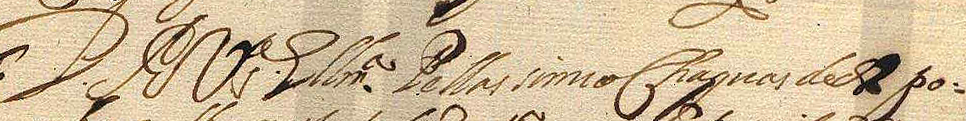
P A Vsa Ellm.a Pellas simco Chaguas de Xo po
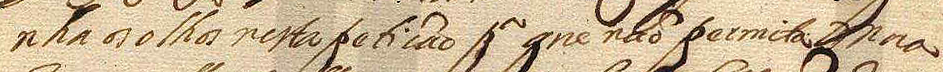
nha os olhos nesta petição pa que naõ permita mora
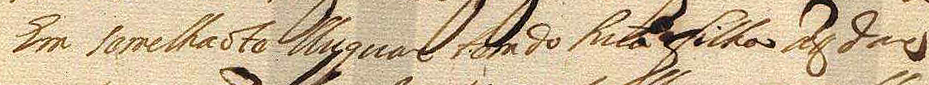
Em semelhaõte lluguar temdo huā filha a q̄ dar
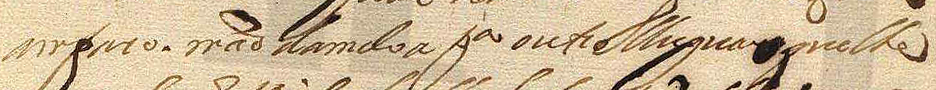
amparo. mãodamdo a pa outro lluguar que lhe
